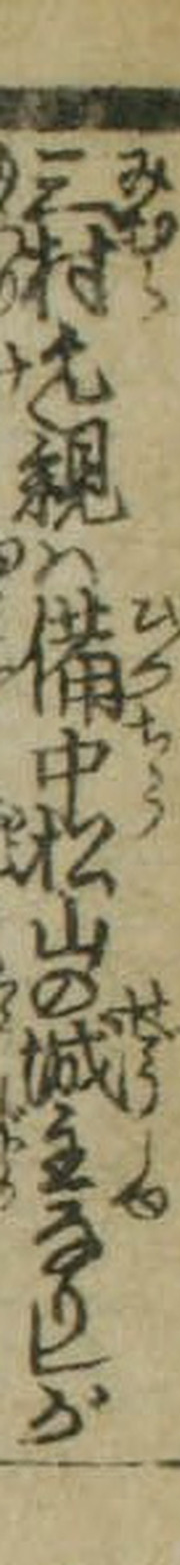三村元親は備中松山の城主なりしが
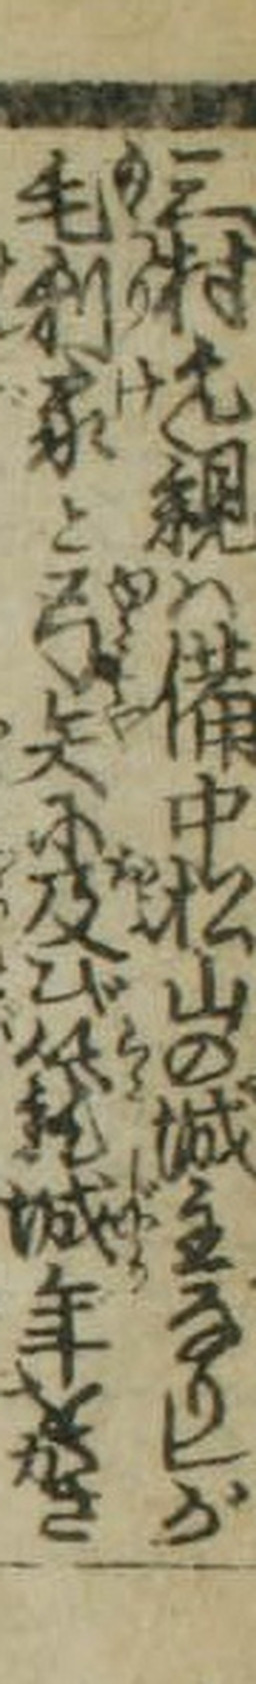毛利家と弓矢に及び籠城年をかさ
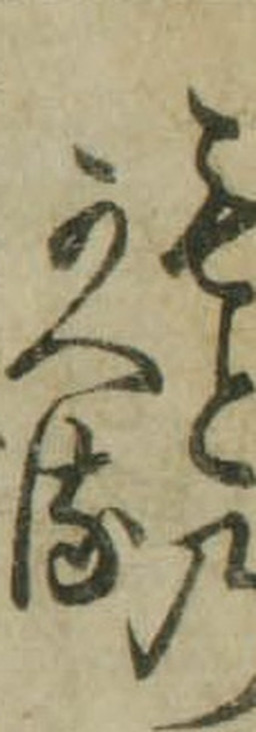かへる
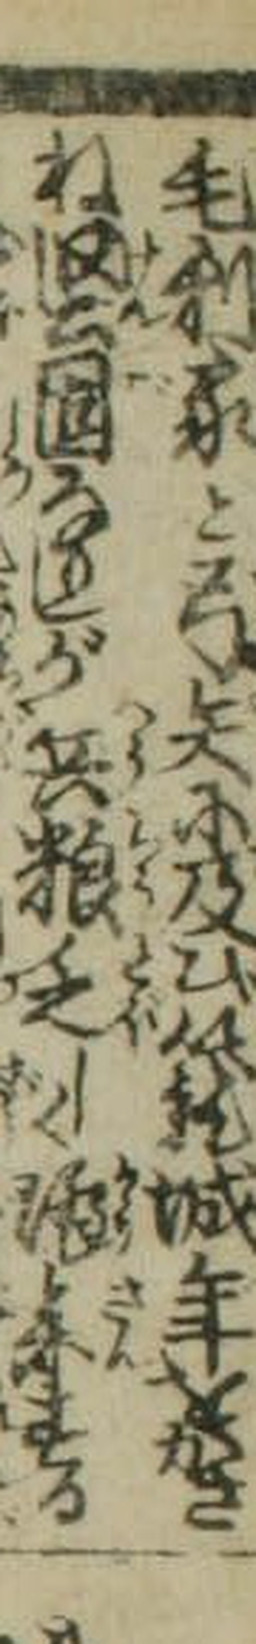ね堅固なりしが兵粮乏しく降参する
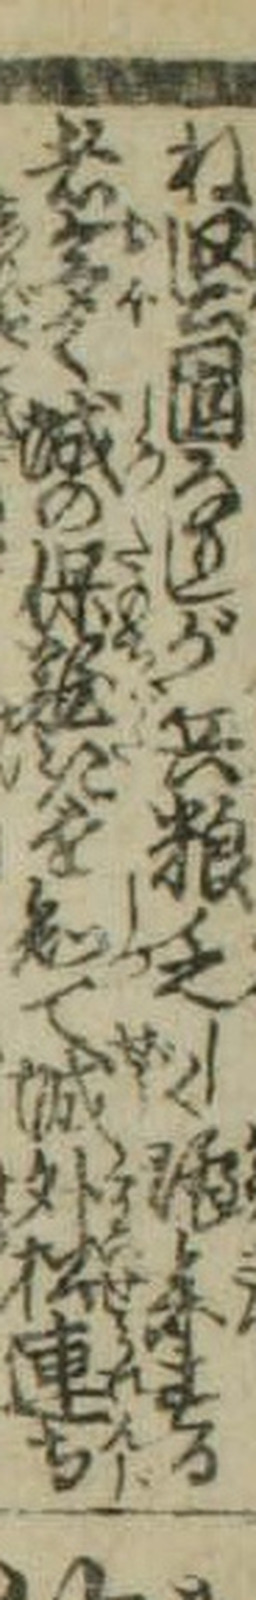者多く城の保難きを知て城外松連寺
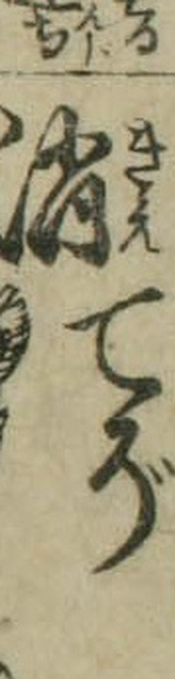消てぞ
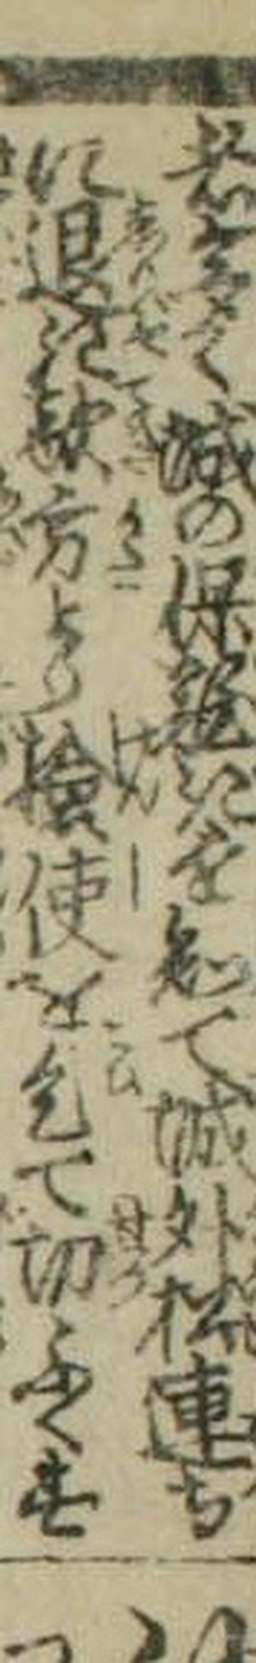に退き敵方より検使を乞て切ふくす
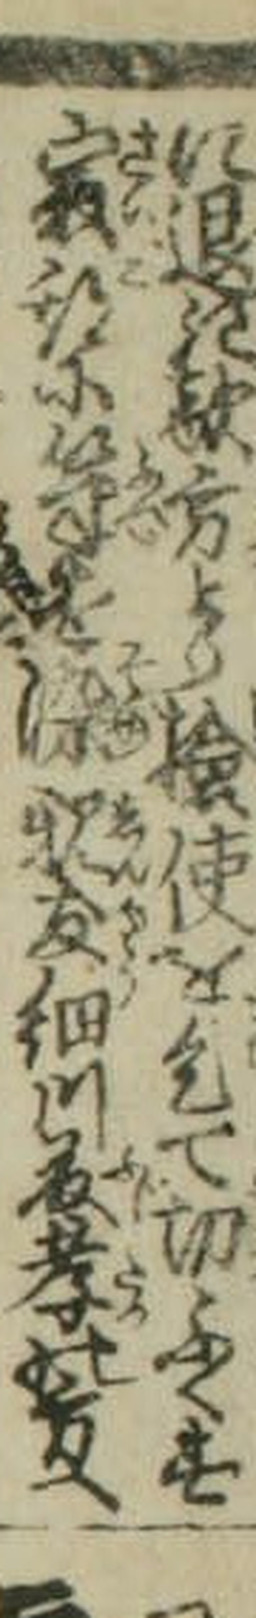最期に筆を染親友細川藤孝の方へ
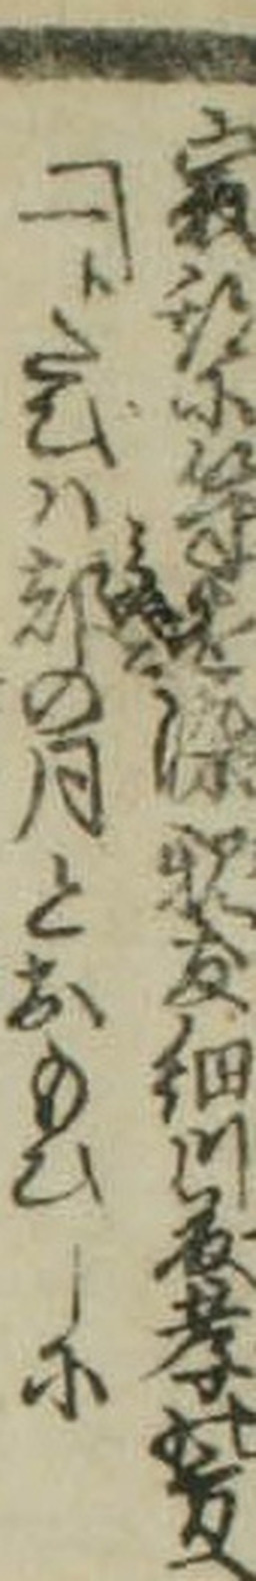〽一とたびは都の月とおもひしに
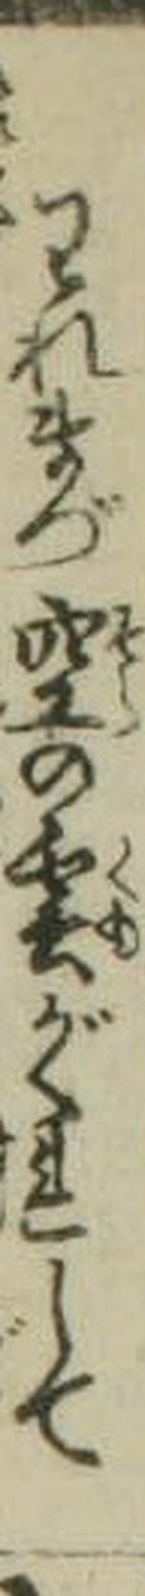われまづ空の雲がくれして
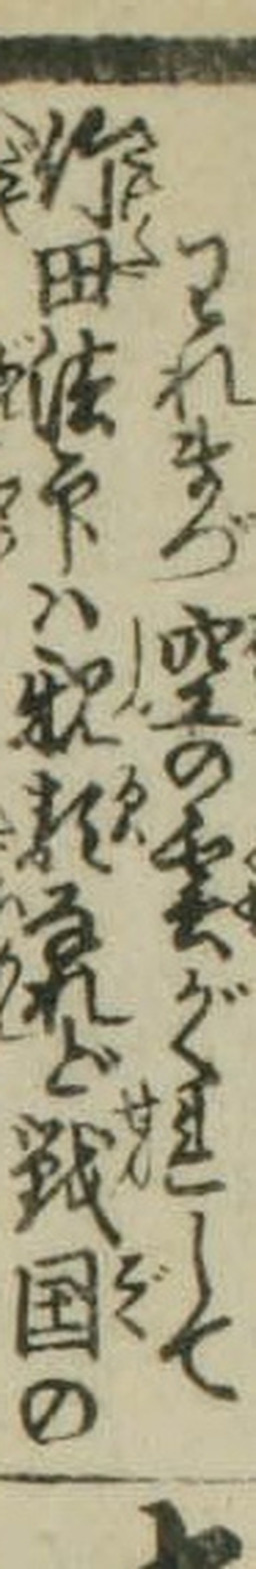竹田法印は親類なれど戦国の
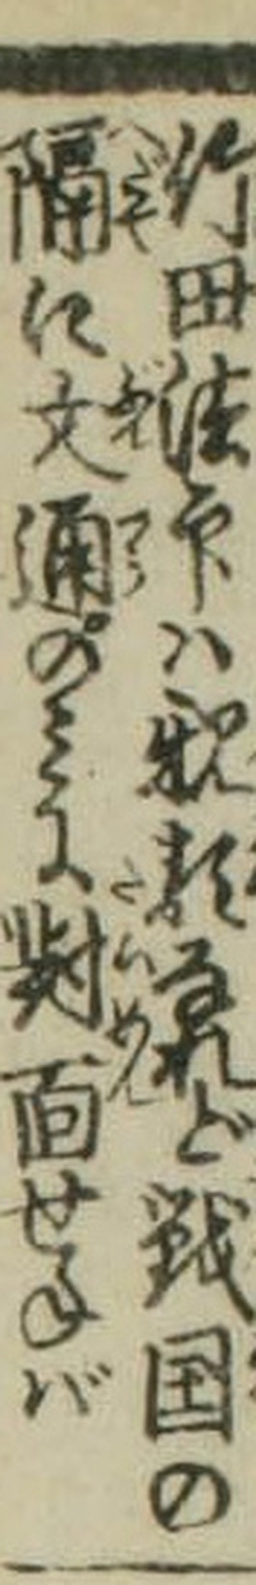隔に文通のみに対面せねば
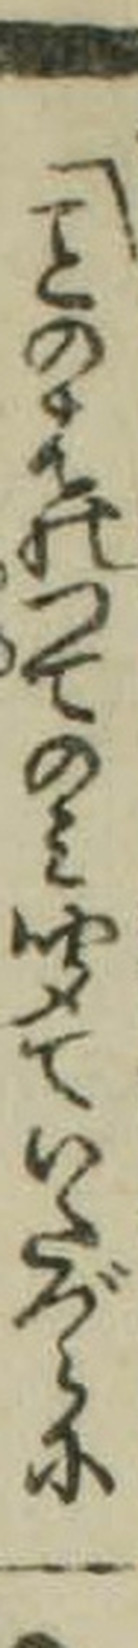〽ことのはのつてのみ聞ていたづらに
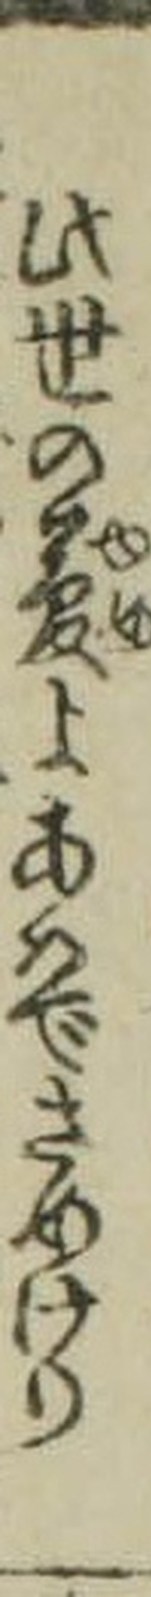此世の夢よあはでさめけり
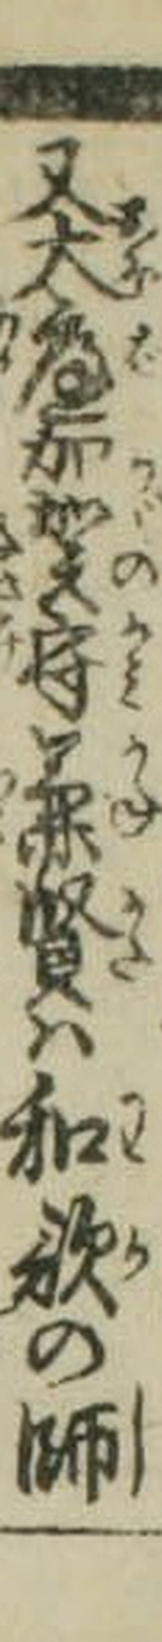又大庭加賀守兼賢は和歌の師
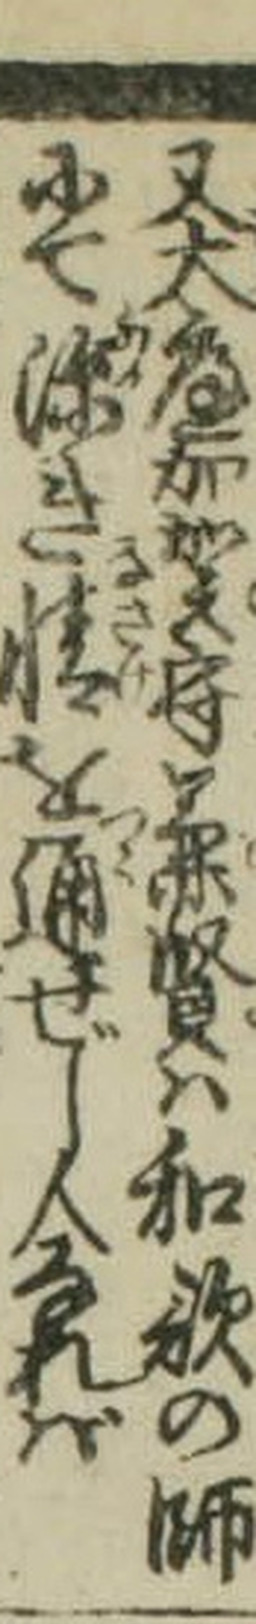にて深き情を通ぜし人なれば
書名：續英雄百人一首
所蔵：東京学芸大学附属図書館
